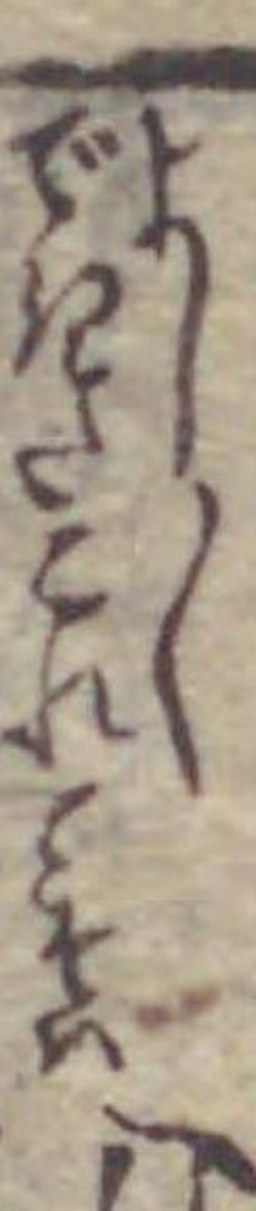できたこれこそは
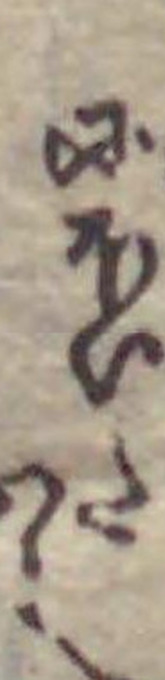にほいた
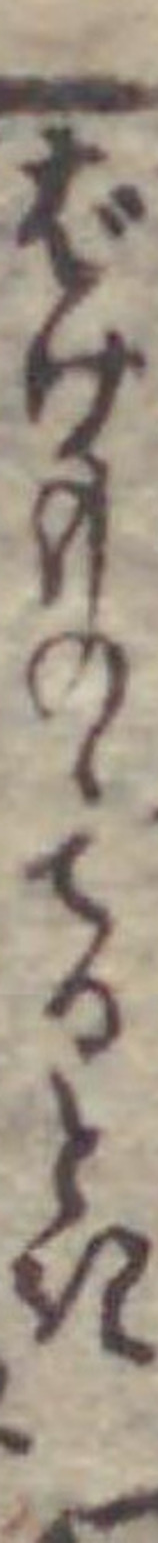ばけものゝてるとき
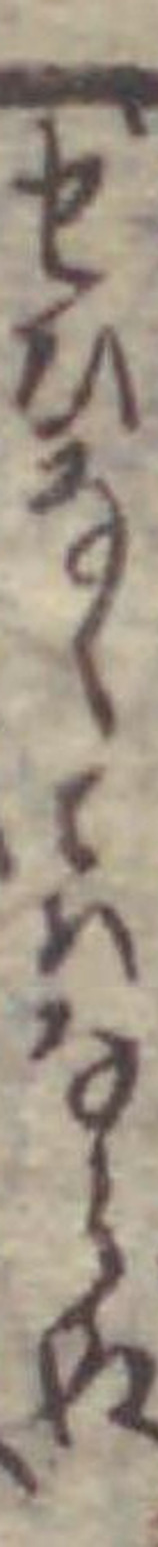せひなくてはならぬ
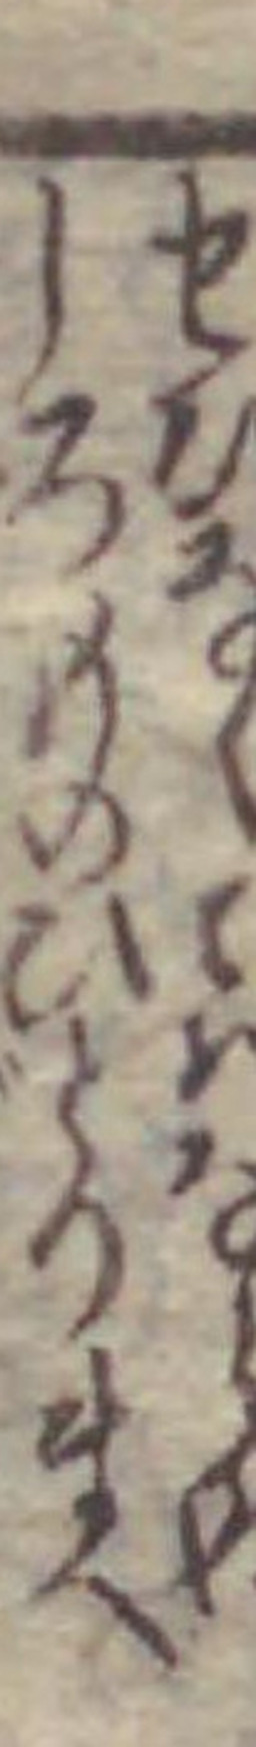しろものひとりまへ
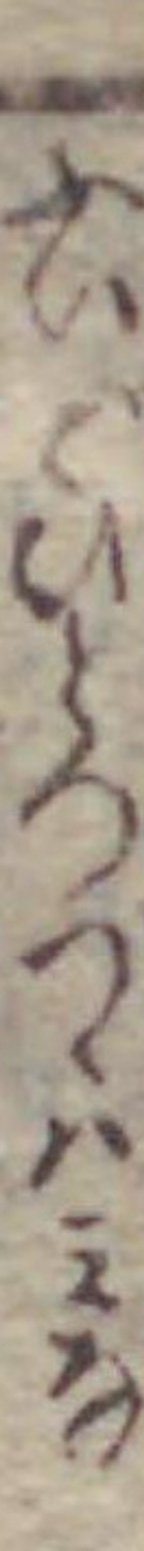ふいごひとつづゝはみな
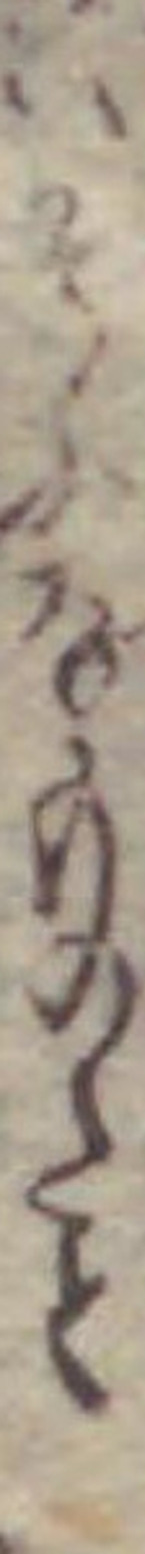かいそふなものたと
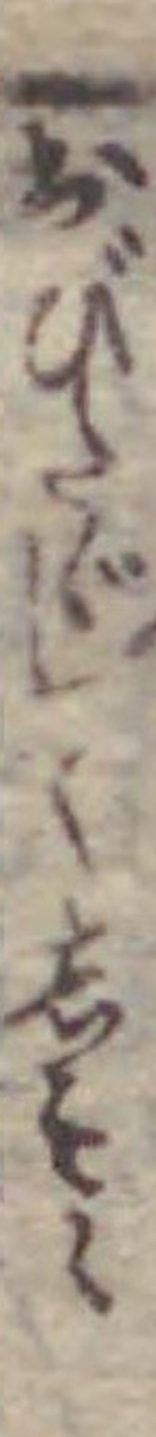おびたゞしくしこみ
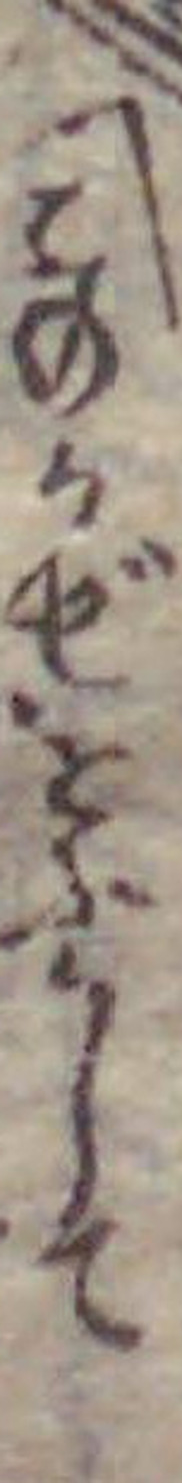〽このかぜをふかして
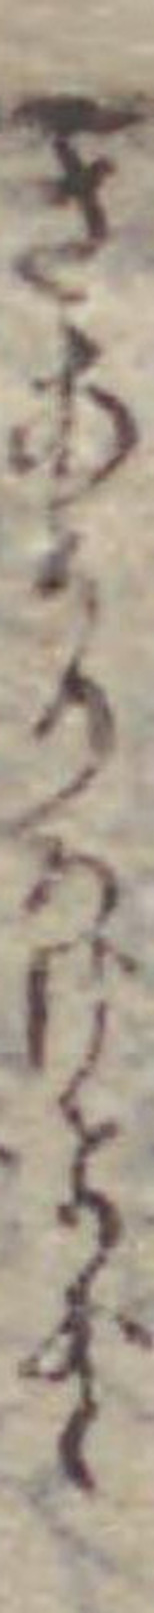さあうりかけよふと
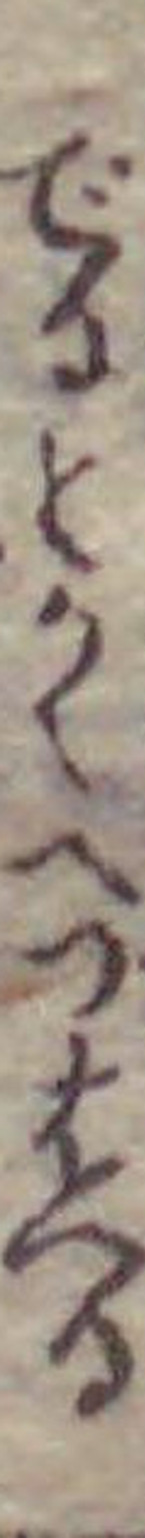でるとかくへつはへる
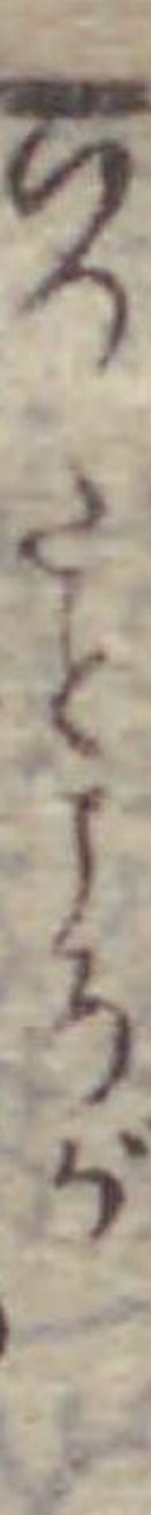いつたところが
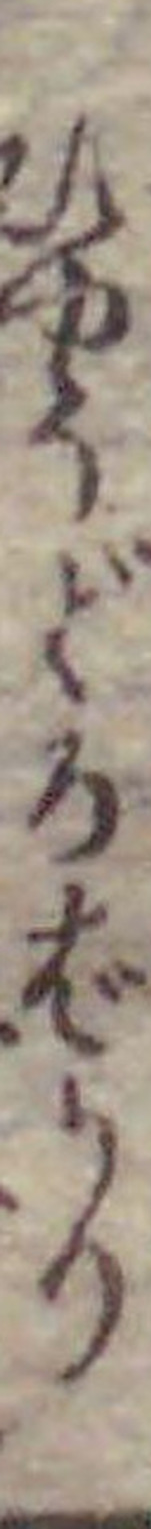ひやうどろばかり
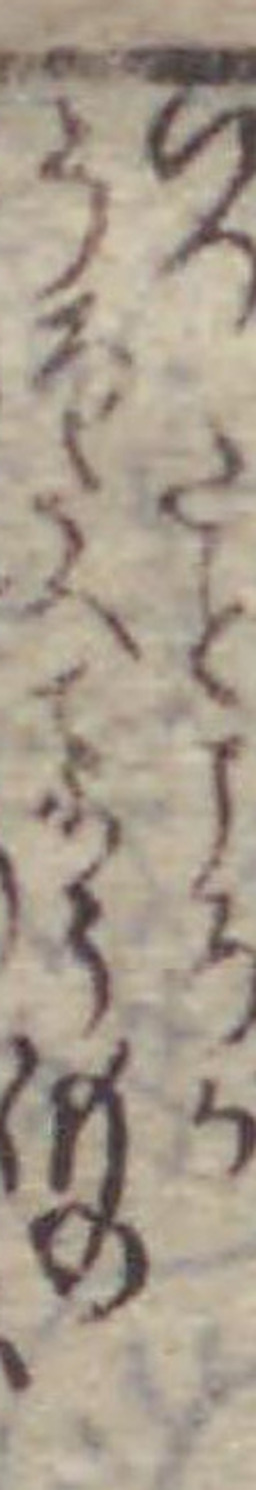うろたへてかうもの
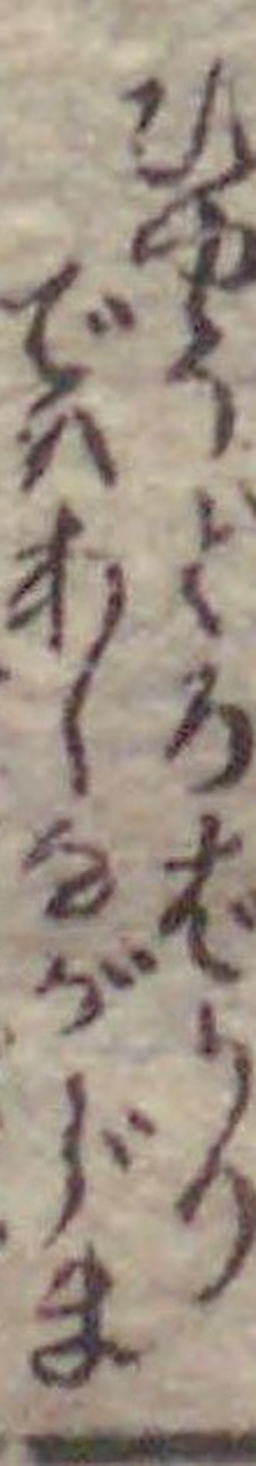ではあしながじま
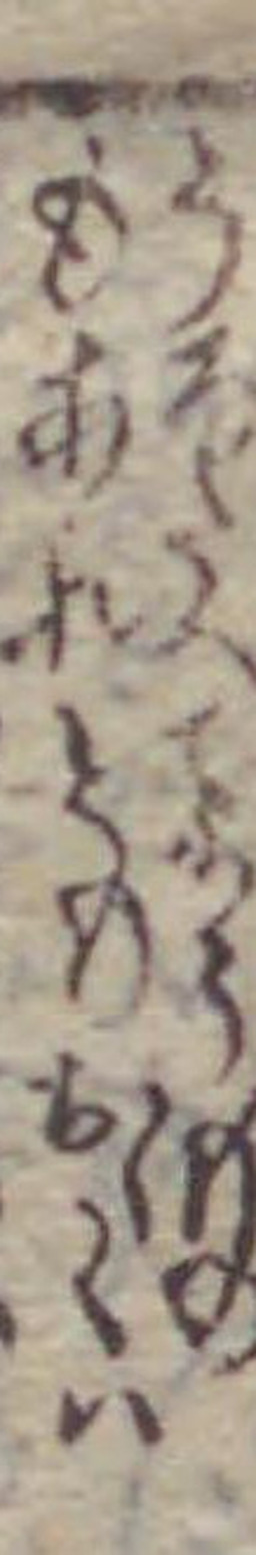もあれともおゝくは
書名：化物見世開 : 2巻
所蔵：国立国会図書館 National Diet Library, JAPAN
